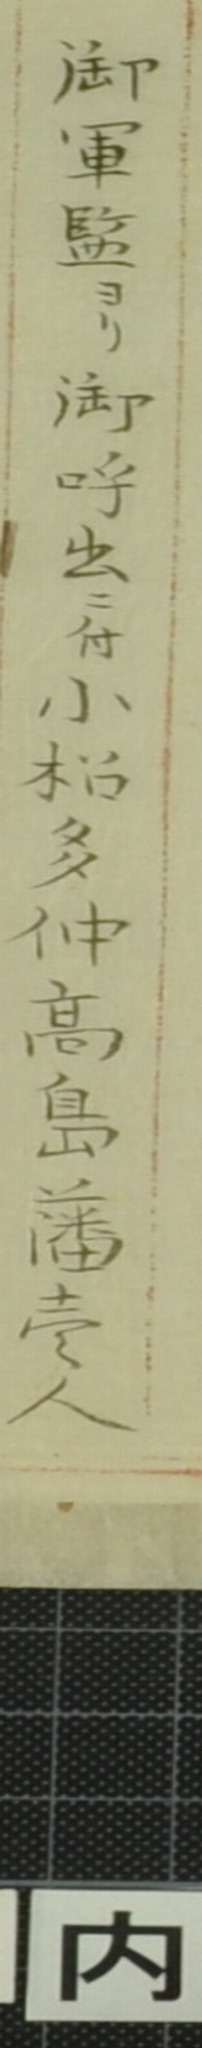一御軍監ヨリ御呼出ニ付小松多仲高嶋藩壹人
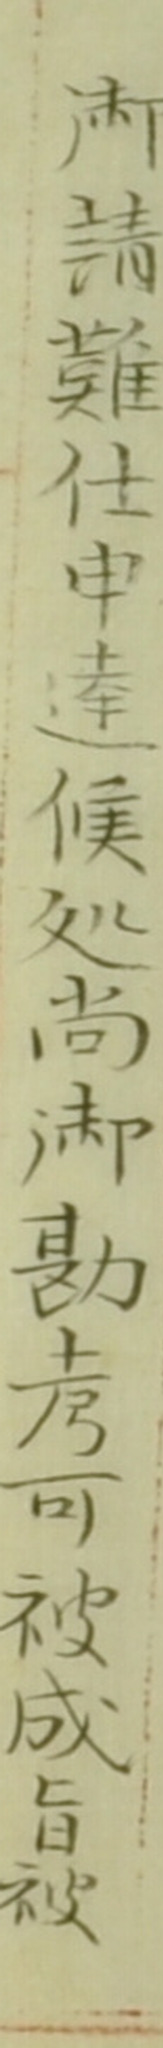御請難仕申達候処尚御勘考可被成旨被

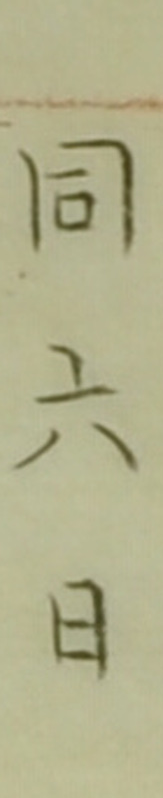同六日
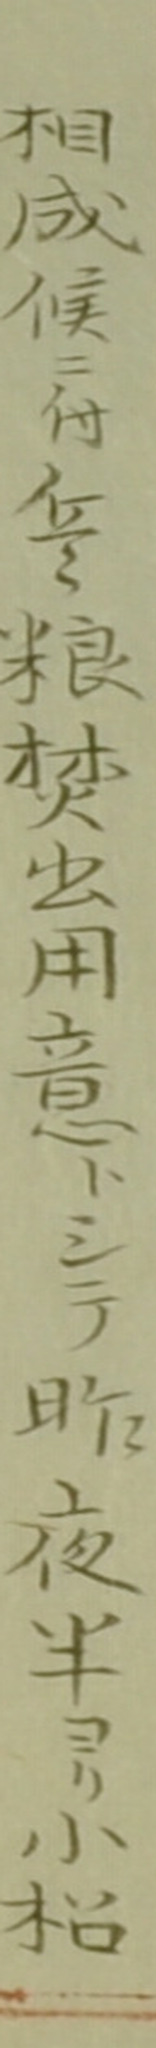相成候ニ付兵粮炊出用意トシテ昨夜半ヨリ小松
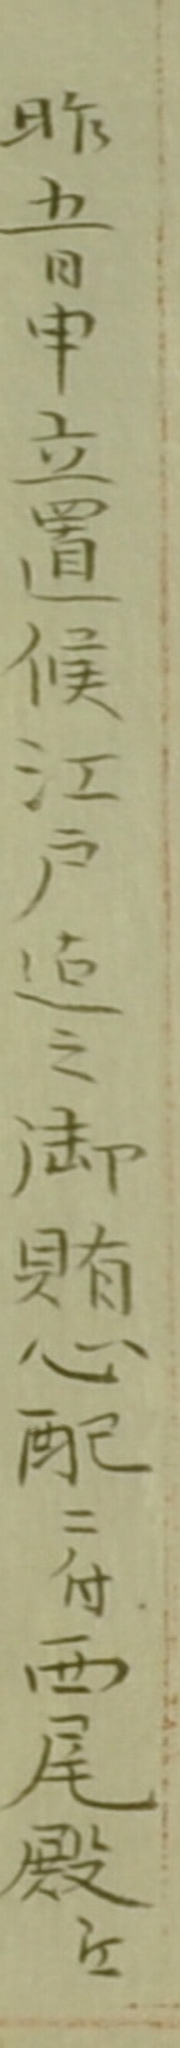一昨五日申立置候江戸迄之御賄心配ニ付西尾殿江
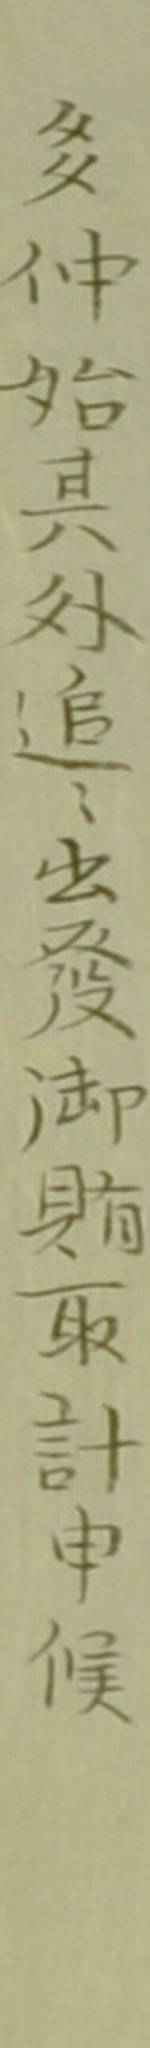多仲始其外追々出発御賄取計申候
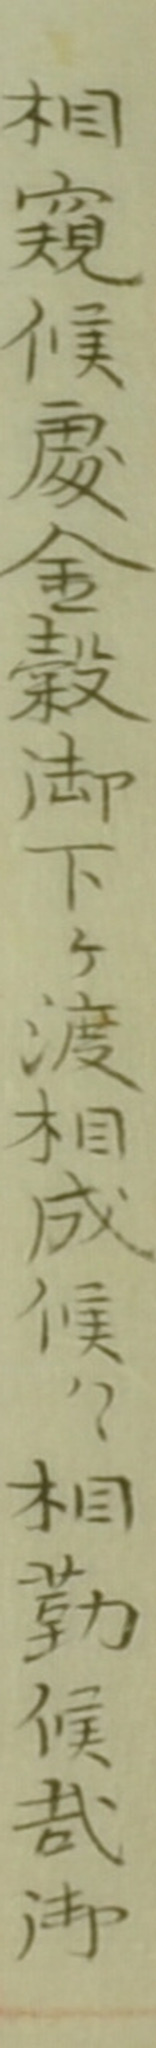相窺候処金穀御下ゲ渡相成候ハゝ相勤候哉御
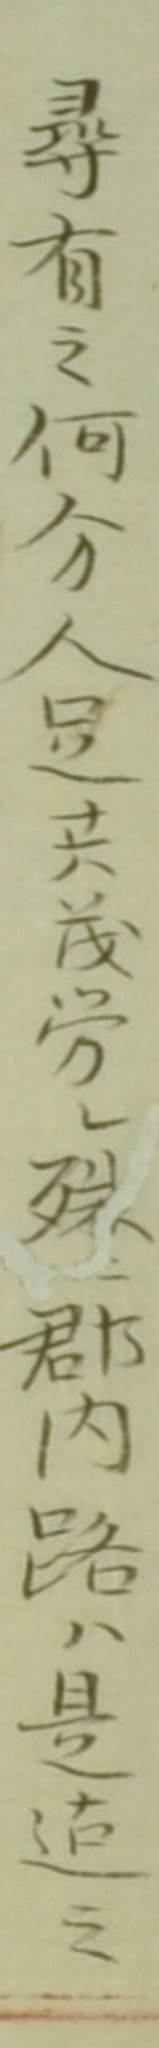尋有之何分人足共茂労レ殊ニ郡内路ハ是迄之
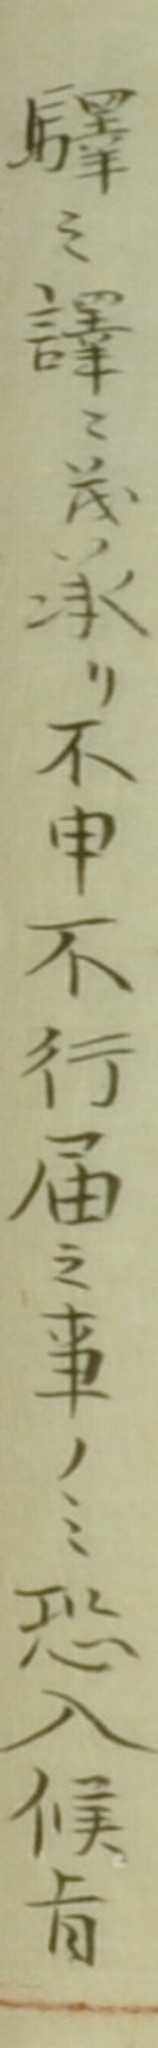駅之訳ニ茂承リ不申不行届之事ノミ恐入候旨
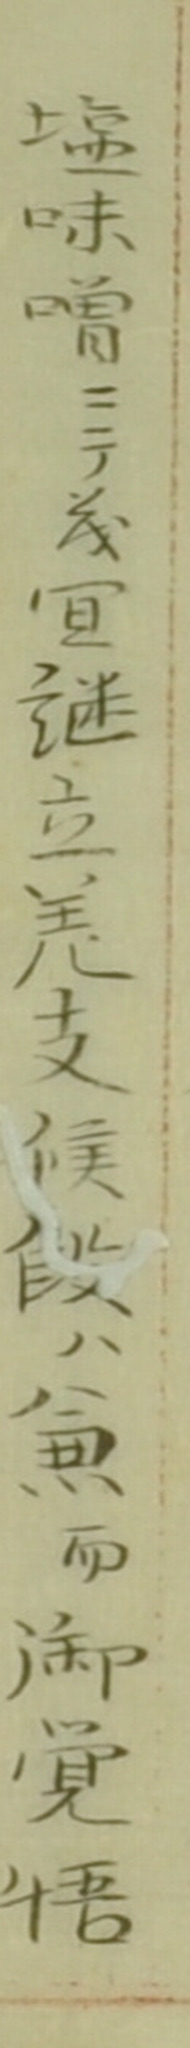塩味噌ニテ茂宜継立差支候段ハ兼而御覚悟
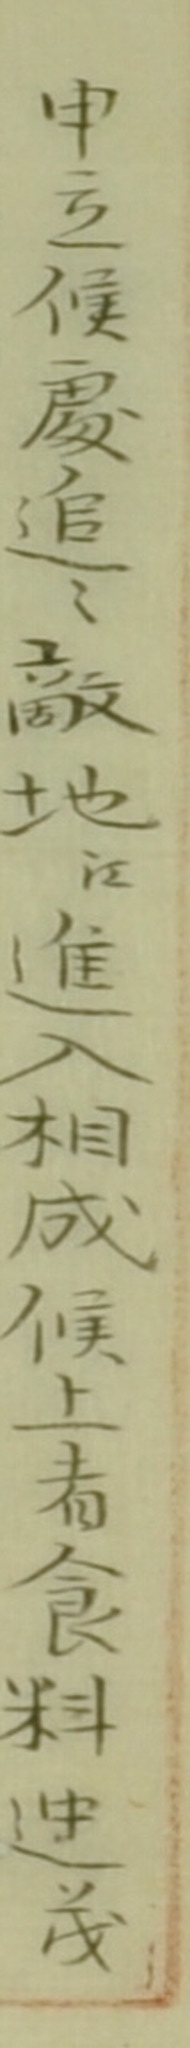申立候処追々敵地江侵入相成候上者食料迚茂
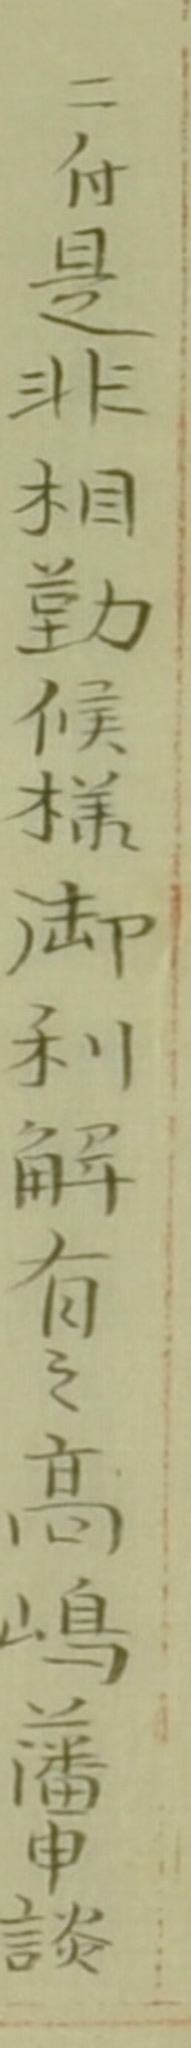ニ付是非相勤候様御利解有之高嶋藩申談
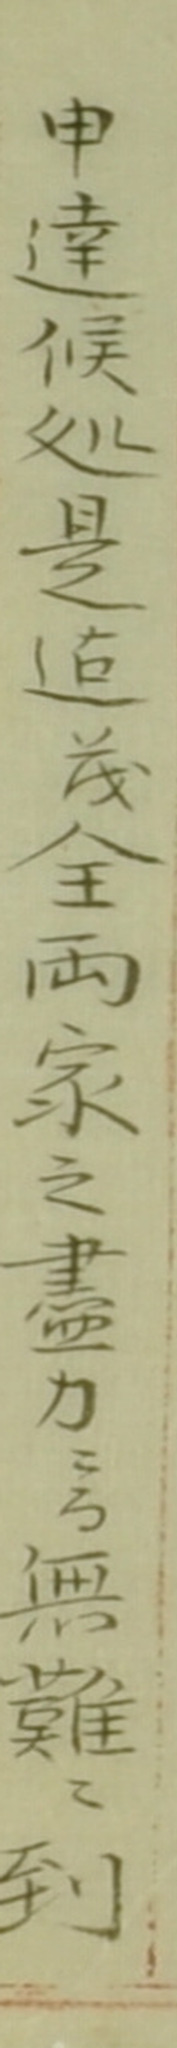申達候処是迄茂全両家之尽力ニ而無難ニ到
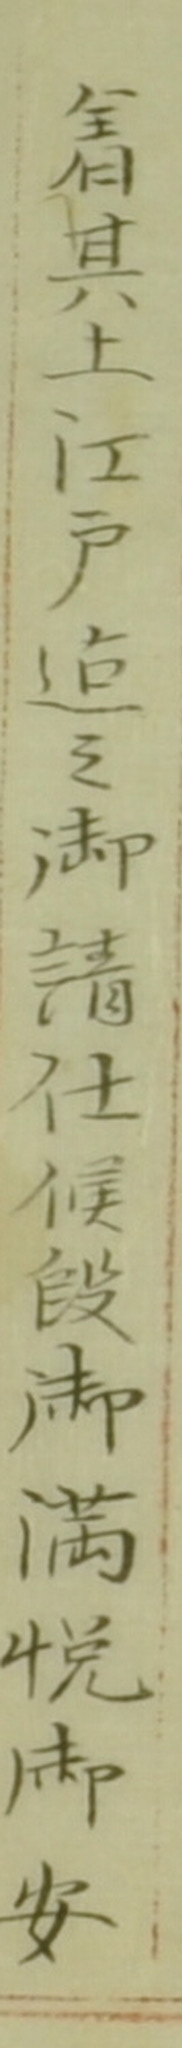着其上江戸迄之御請仕候段御満悦御安
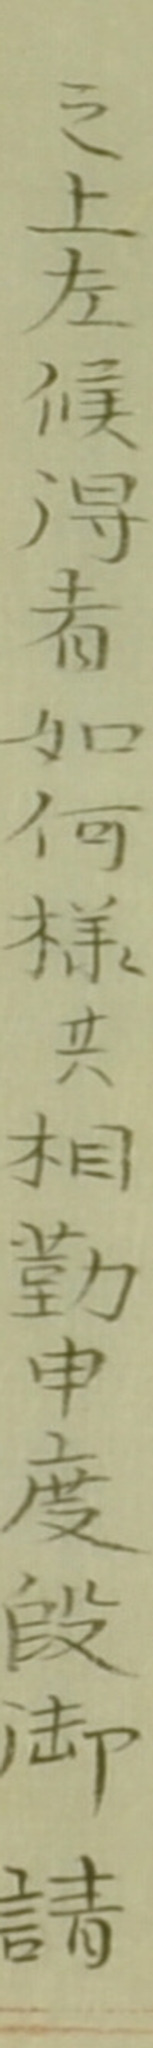之上左候得者如何様共相勤申度段御請
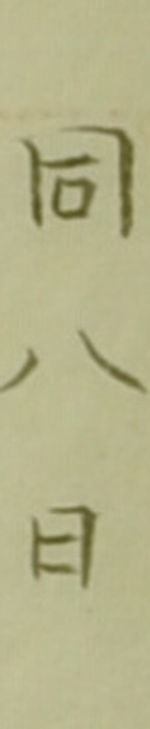同八日
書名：御東征ニ付甲州口兵食人馬御賄之事件（控）
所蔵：伊那市立高遠町図書館・合同会社AMANE
